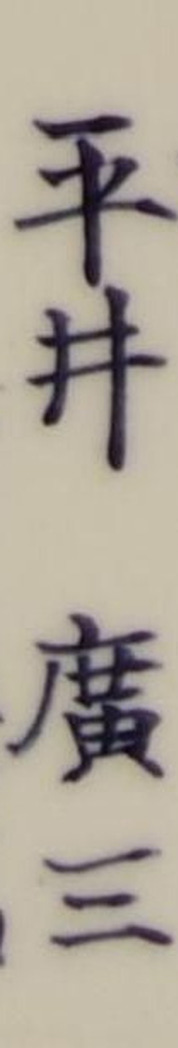平井広三
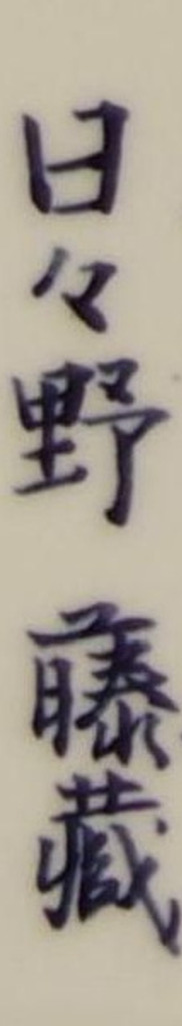日々野藤蔵
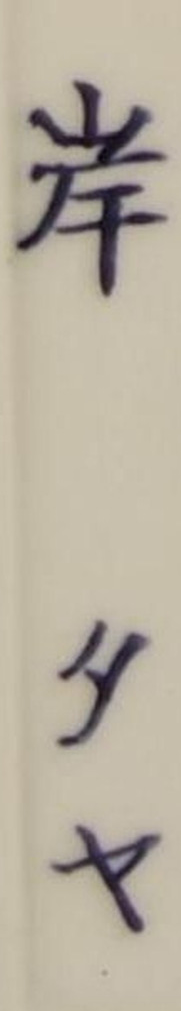岸タヤ

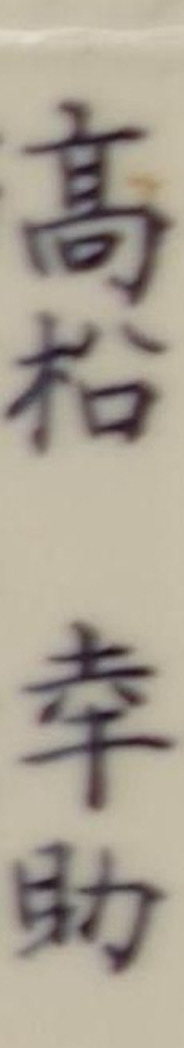髙松幸助
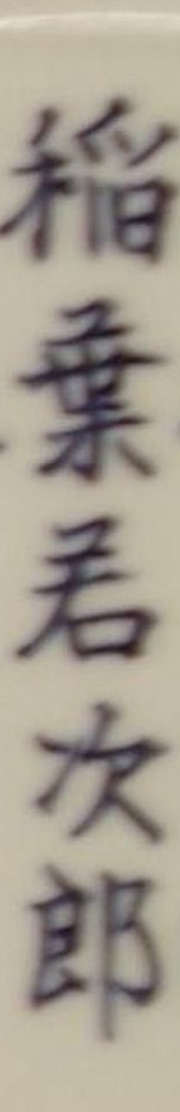稲葉若次郎
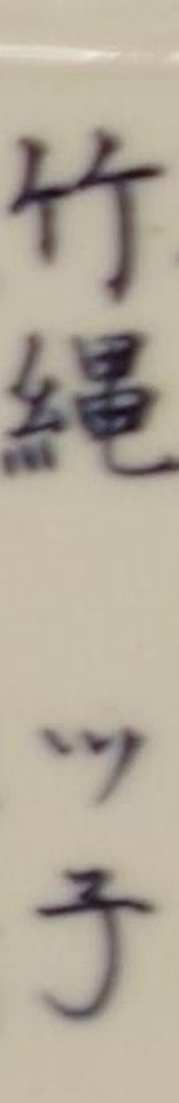竹縄ツ子
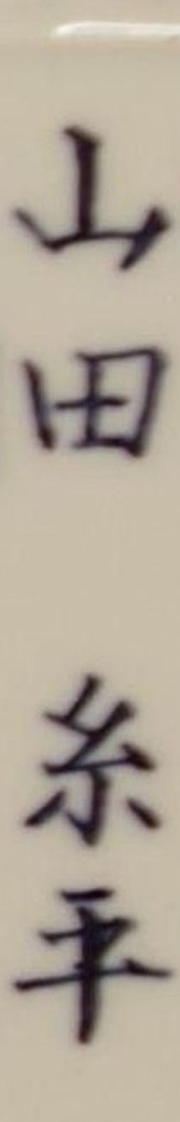山田糸平
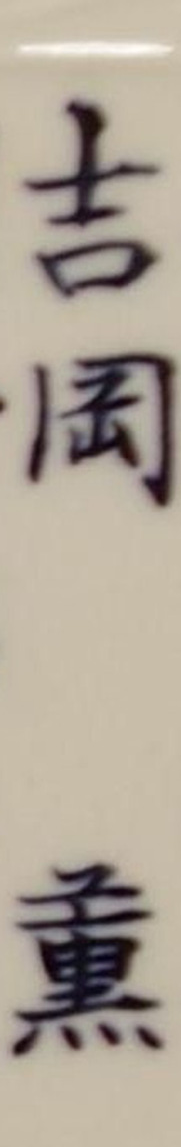吉岡薫
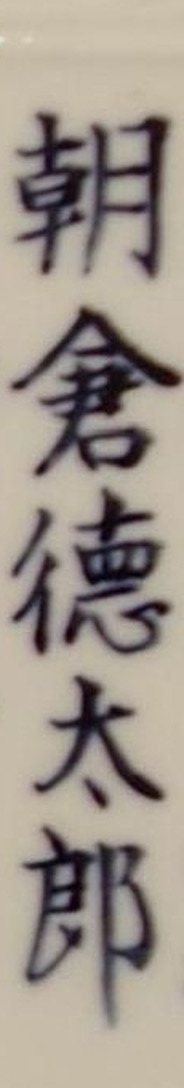朝倉徳太郎
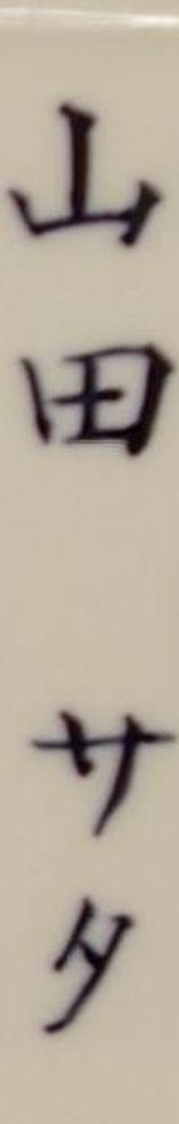山田サタ
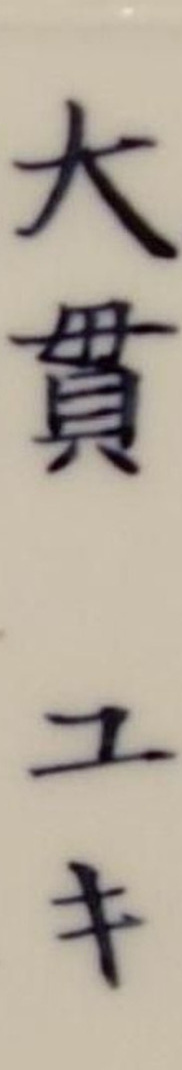大貫ユキ
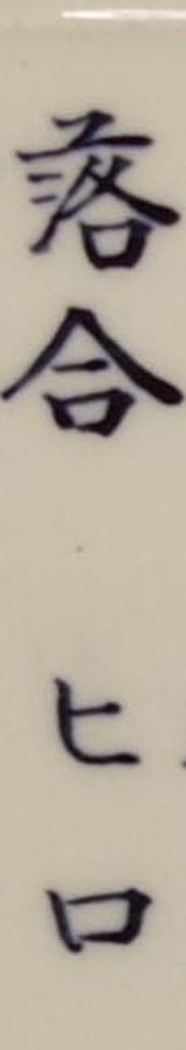落合ヒ口
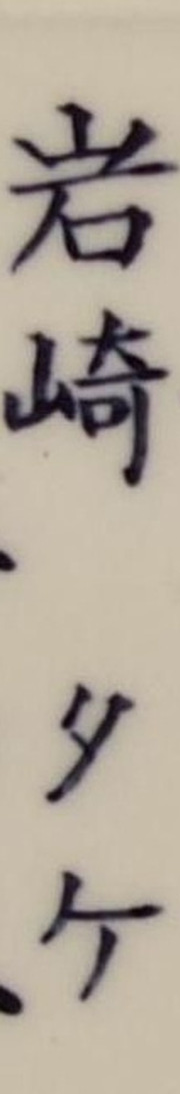岩崎夕ケ
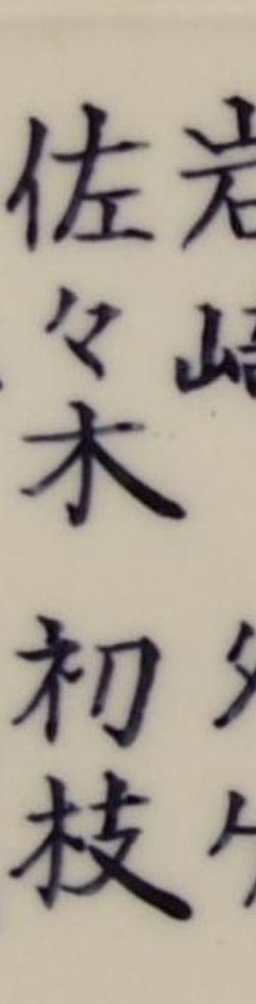佐々木初枝
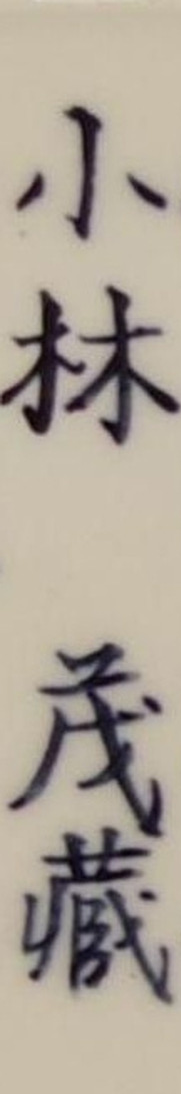小林茂蔵
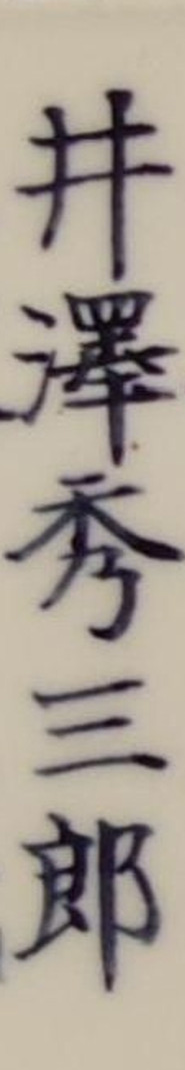井澤秀三郎
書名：M~S
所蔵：高野山金剛峯寺
